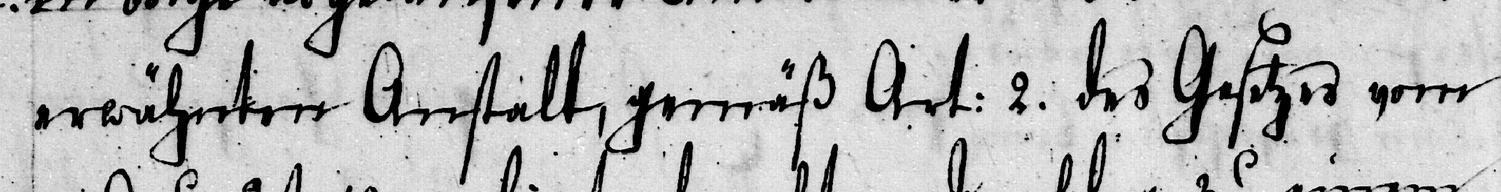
erwähnten Anstalt, gemäß Art: 2. des Gesetzes vom
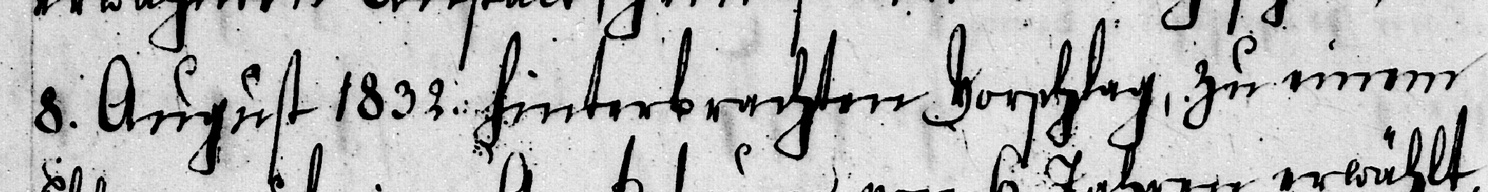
8. August 1832. hinterbrachten Vorschlag, zu einem
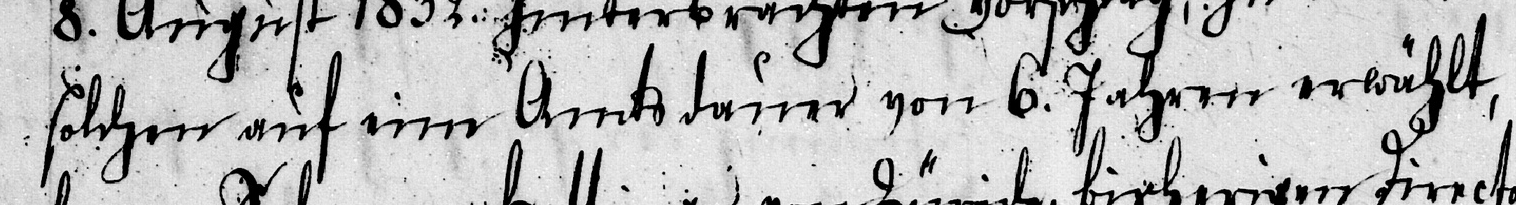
solchen auf eine Amtsdauer von 6 .Jahren erwählt,
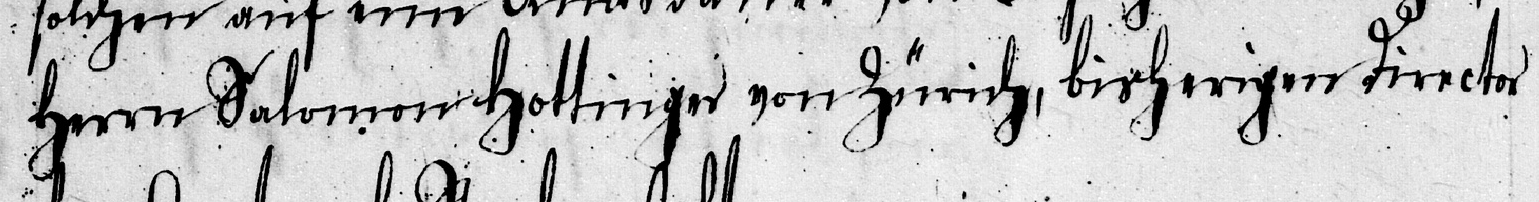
Herrn Salomon Hottinger von Zürich, bisherigen Director
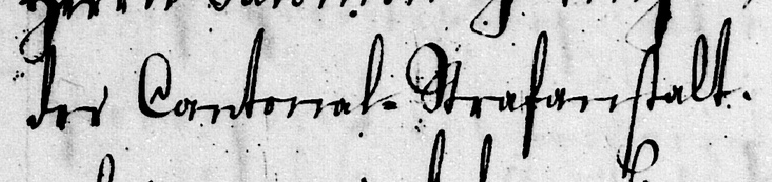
der Cantonal-Strafanstalt.
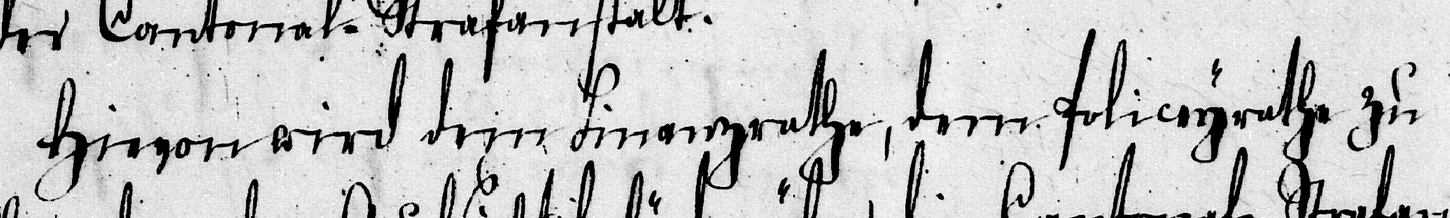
Hievon wird dem Finanzrathe, dem Policeyrathe zu
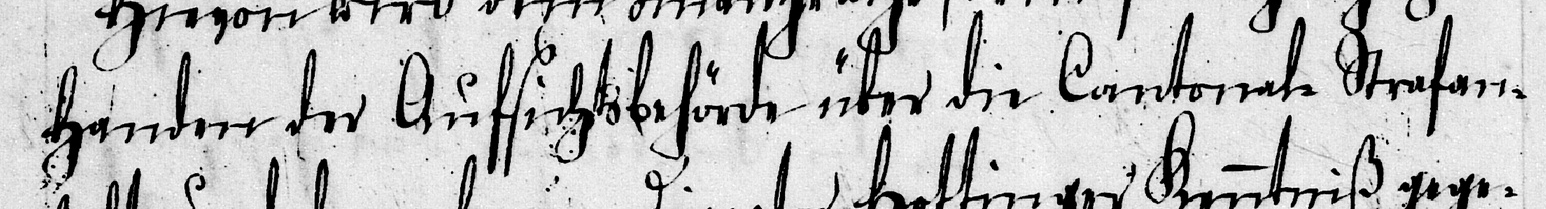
Handen der Aufsichtsbehörde über die Cantonal-Strafan¬
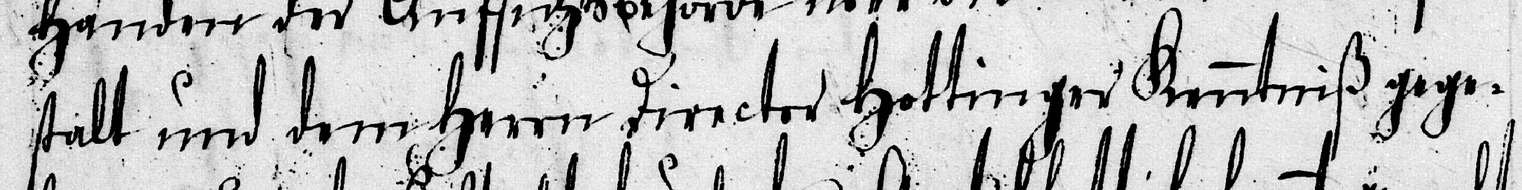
stalt und dem Herrn Director Hottinger Kenntniß gege¬
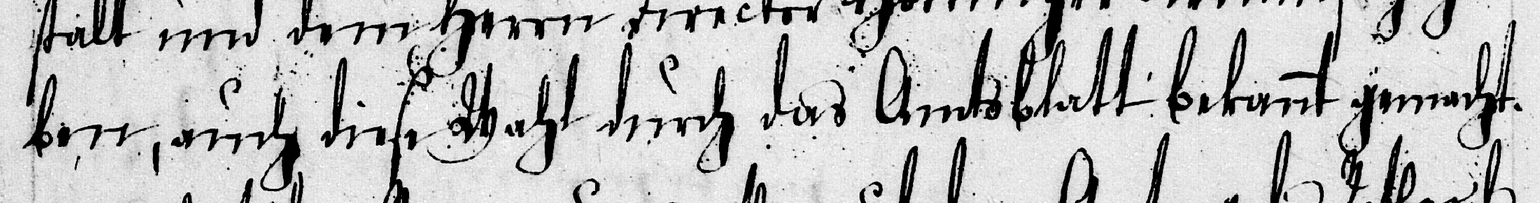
ben, auch diese Wahl durch das Amtsblatt bekannt gemach¬
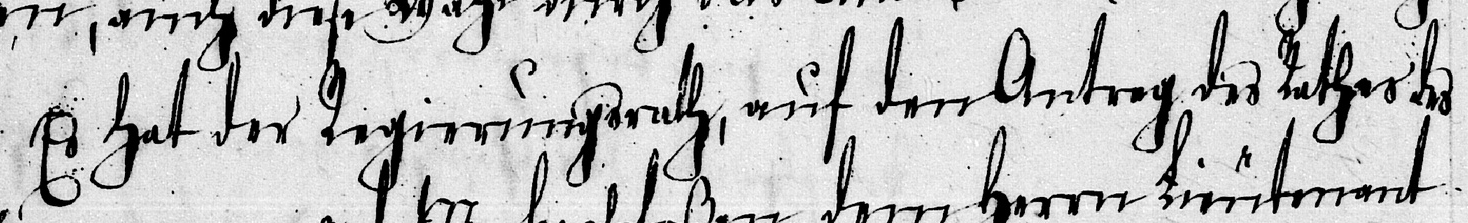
Es hat der Regierungsrath, auf den Antrag des Rathes d¬
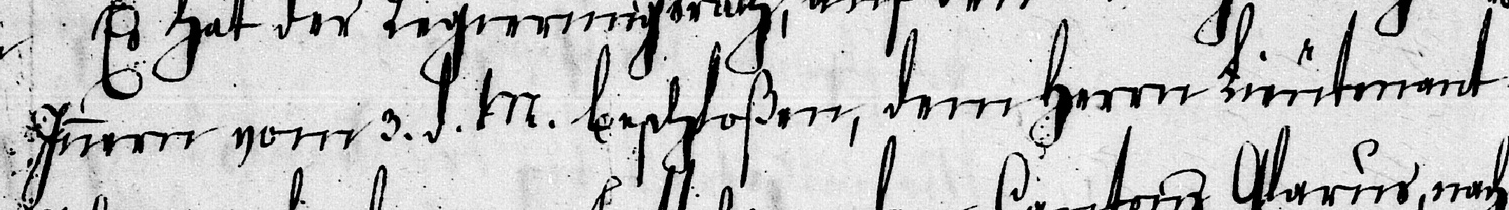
Innern vom 3. d. M. beschloßen, dem Herrn Lieutenant
